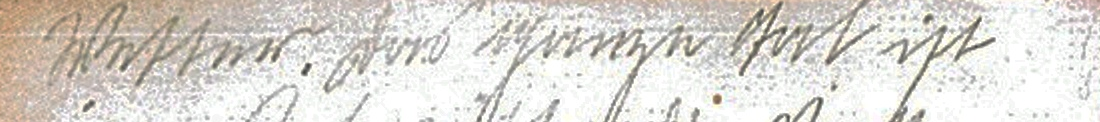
Wetter. Das ganze Tal ist
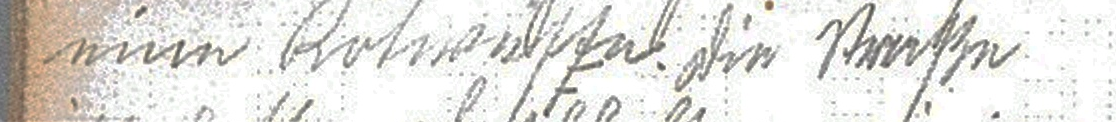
eine Kotwüste. Die Straße
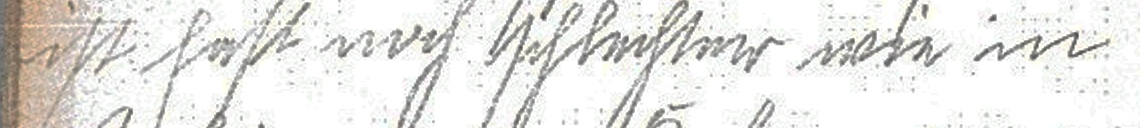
ist fast noch schlechter wie in
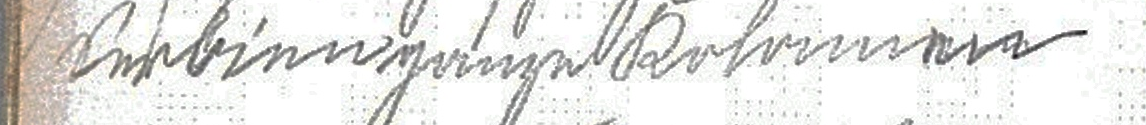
Serbien ganze Kolonnen
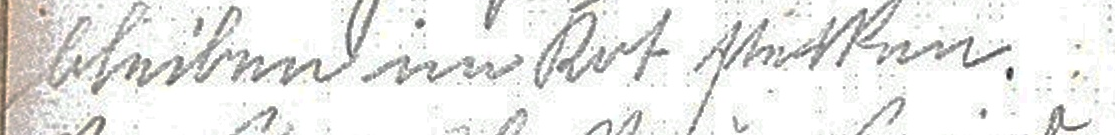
bleiben im Kot stecken.
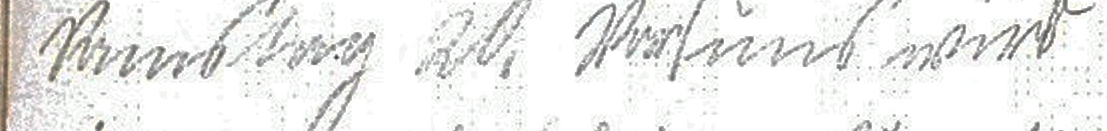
Samstag 20. Vor uns wird
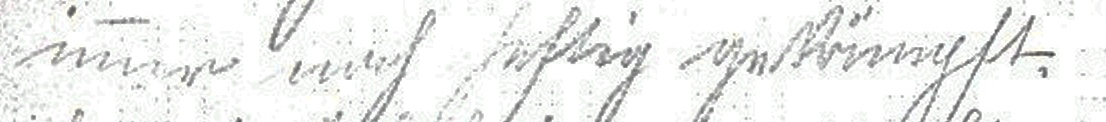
immernoch heftig gekämpft.
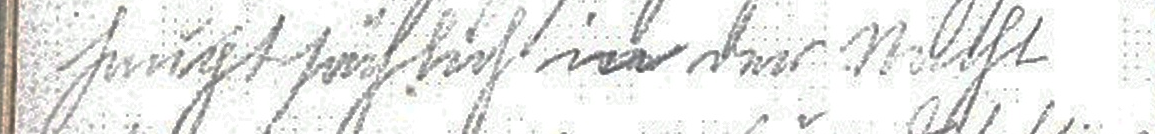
Hauptsächlich in der Nacht
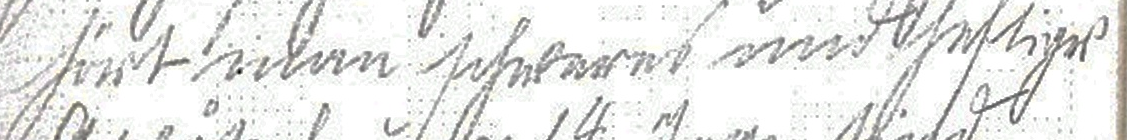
hört man schweres und heftiges
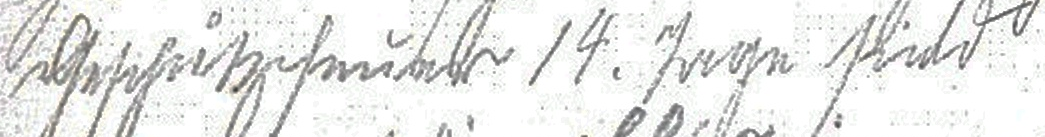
Geschützfeuer. 14 Tage sind
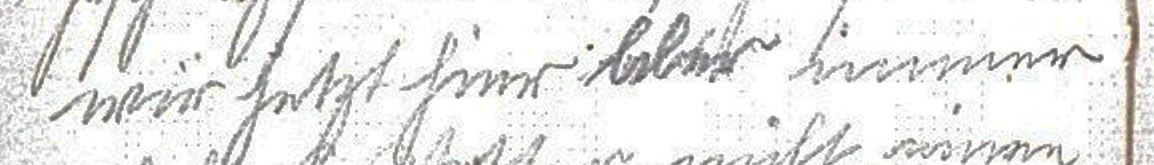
wir jetzt hier aber immer
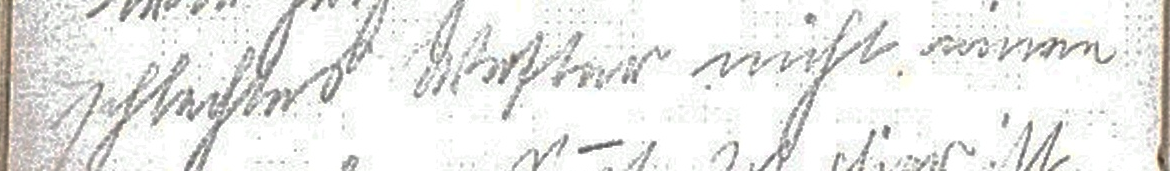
schlechtes Wetter nicht einen
